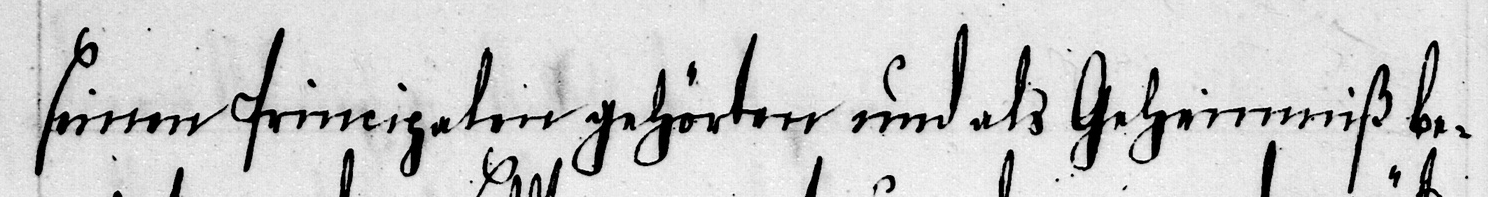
seinen Principalen gehörten und als Geheimniß be¬
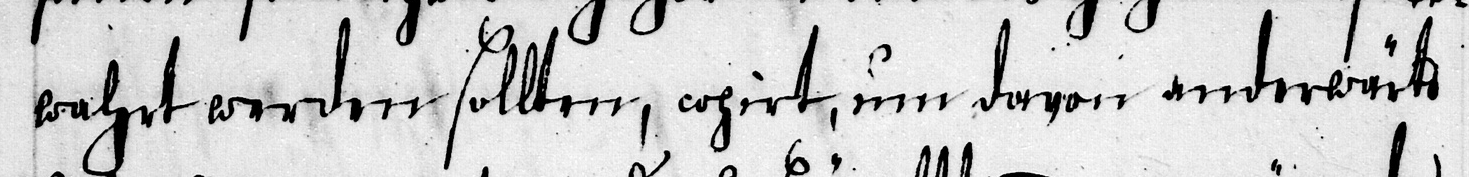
wahrt werden sollten, copirt, um davon anderwärts
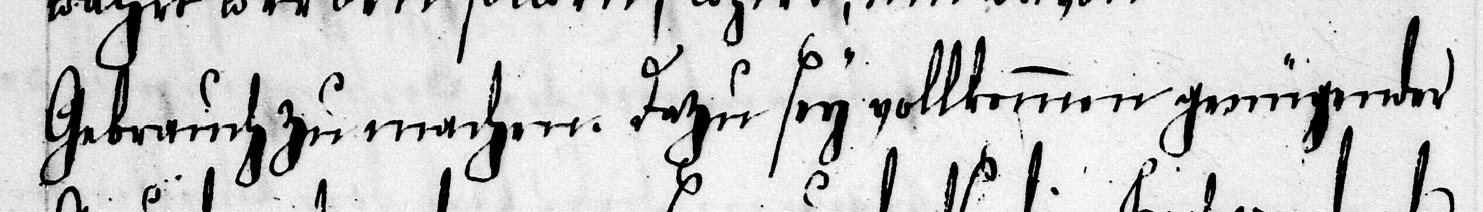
Gebrauch zu machen. Dazu sey vollkommen genügender
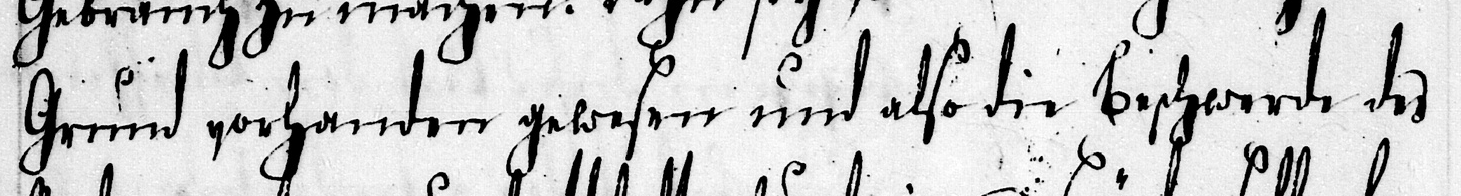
Grund vorhanden gewesen und also die Beschwerde des
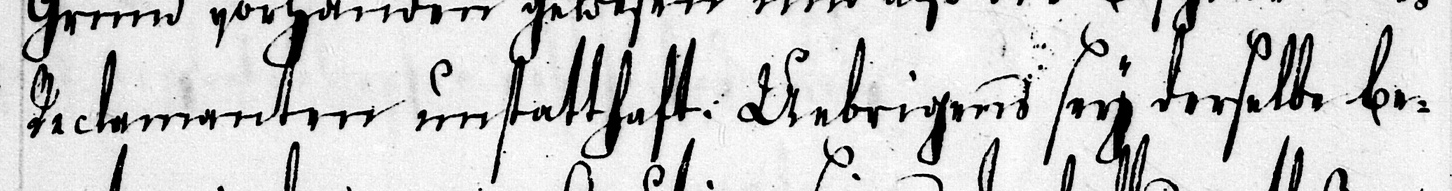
Reclamanten unstatthaft. Uebrigens sey derselbe be¬
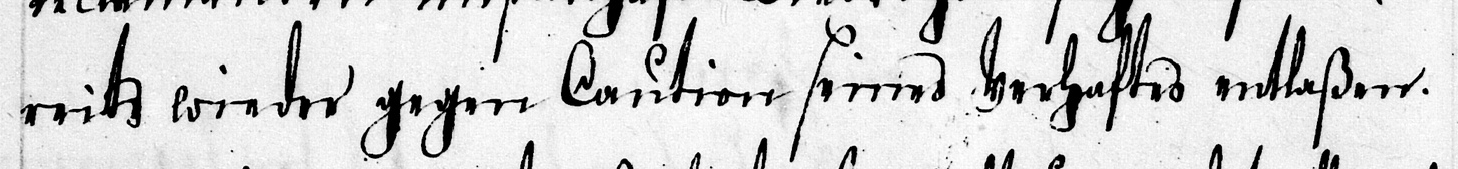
reits wieder gegen Caution seines Verhaftes entlaßen.
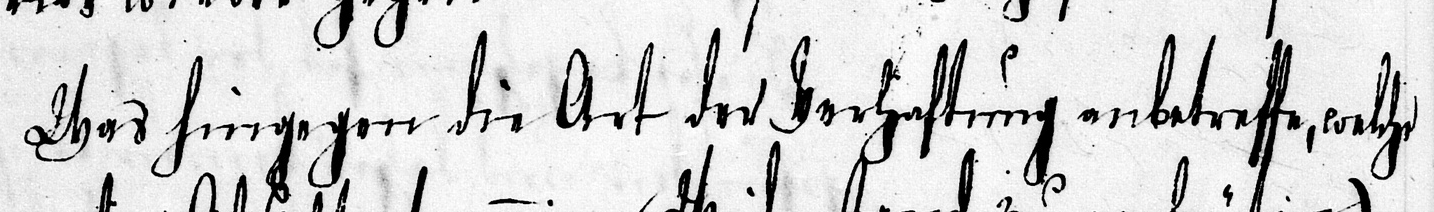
Was hingegen die Art der Verhaftung anbetreffe,
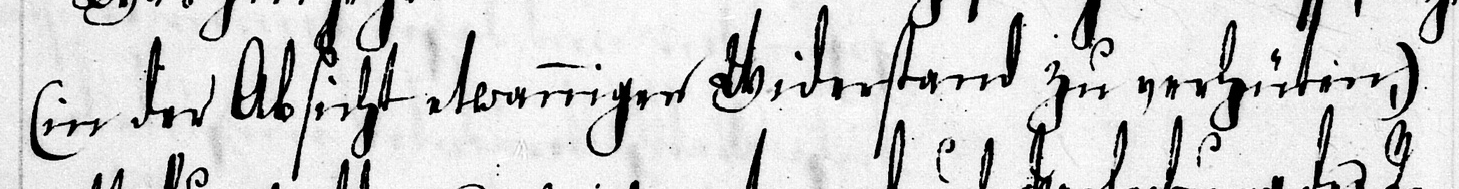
(in der Absicht etwannigen Widerstand zu verhüten,)
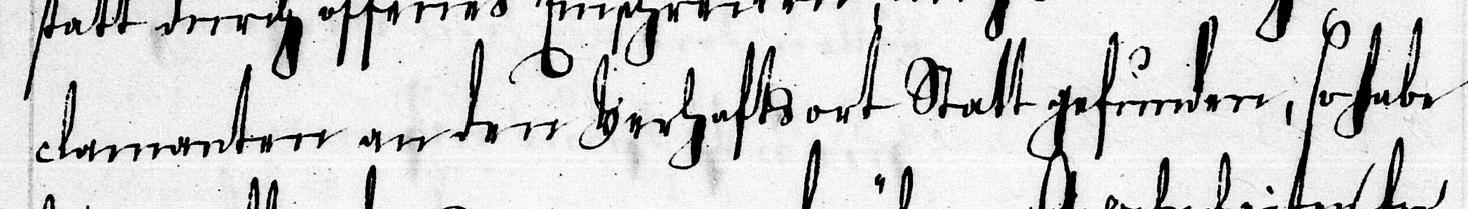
clamanten an den Verhaftsort Statt gefunden, so habe
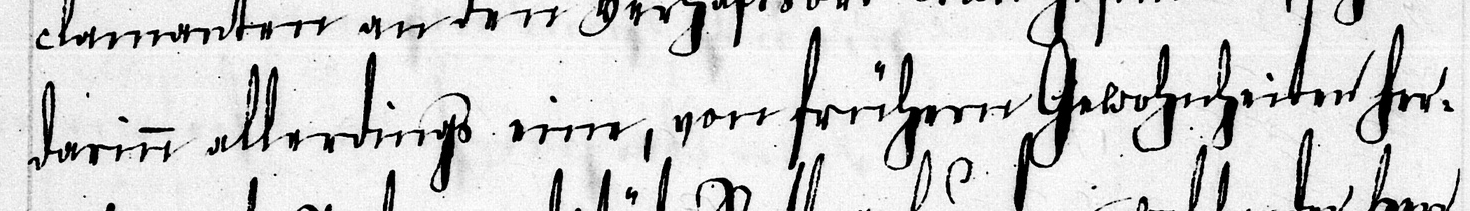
darinn allerdings eine, von frühern Gewohnheiten her¬
